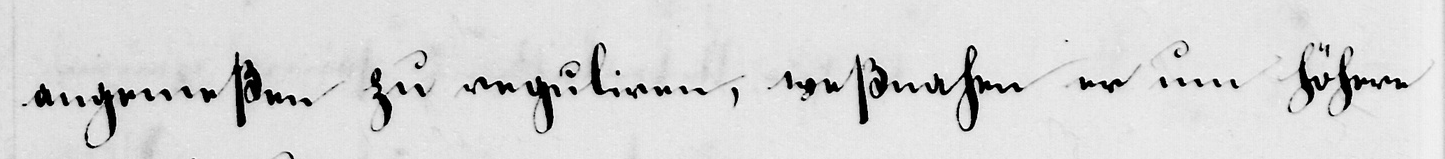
angemeßen zu reguliren, weßnahen er um höhere
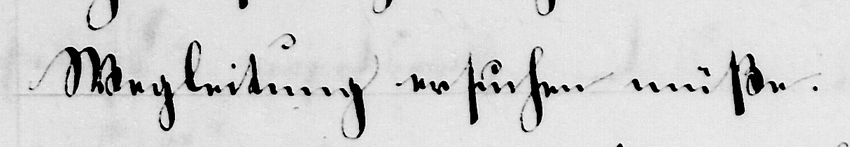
Wegleitung ersuchen müße.
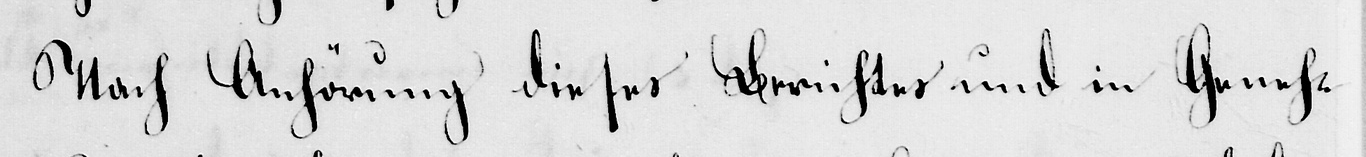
Nach Anhörung dieses Berichtes und in Geneh¬
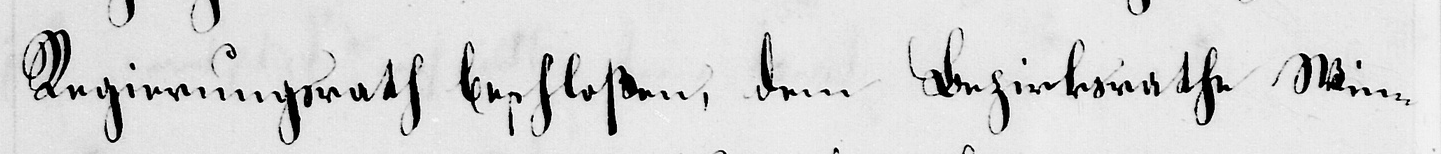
Regierungsrath beschloßen, dem Bezirksrathe Win¬
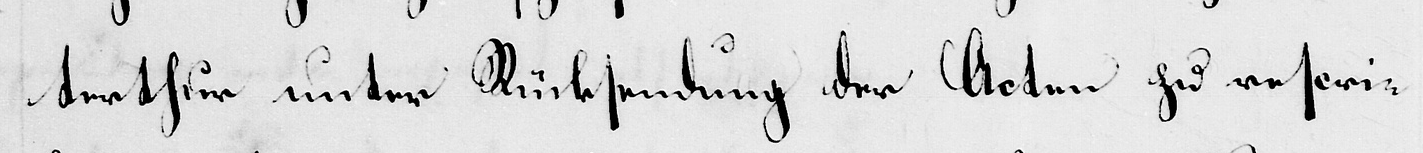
terthur unter Rücksendung der Acten zu rescri¬
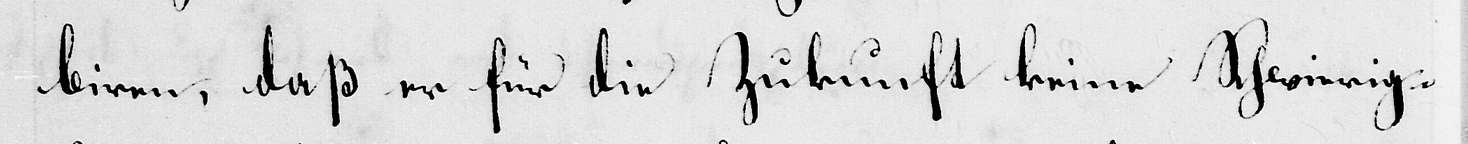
biren, daß er für die Zukunft keine Schwierig¬
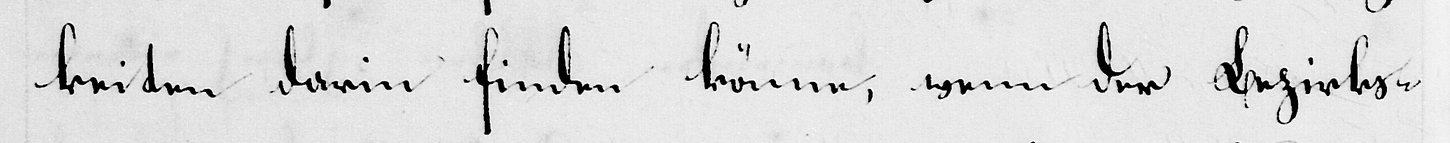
keiten darin finden könne, wenn der Bezirks¬
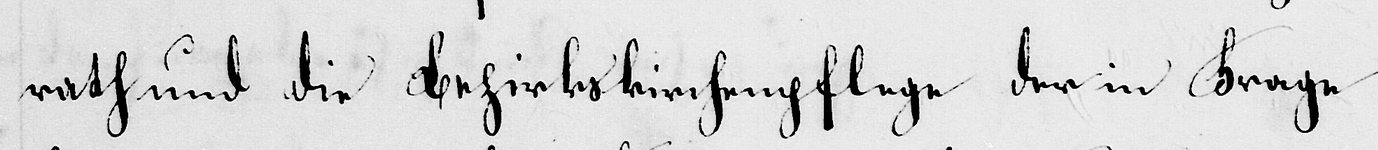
rath und die Bezirkskirchenpflege den in Frage
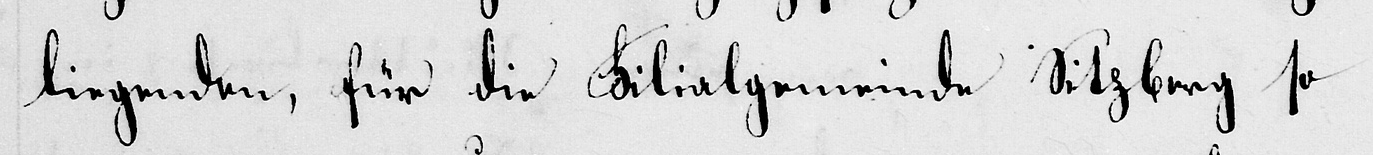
liegenden, für die Filialgemeinde Sitzberg so
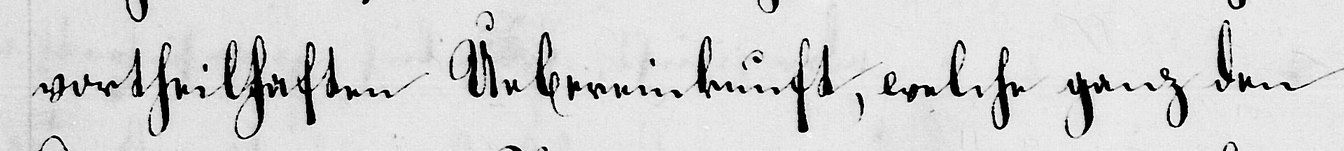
vortheilhaften Uebereinkunft, welche ganz den
